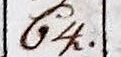64.
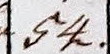54
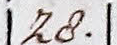28.
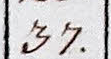37.
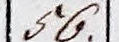56.
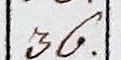36.
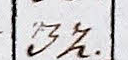32.
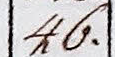46.
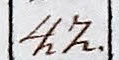42.
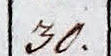30.
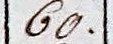60.
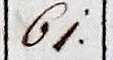61.
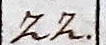22.
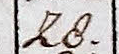28.
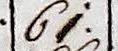61.
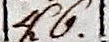46.
